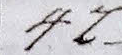42
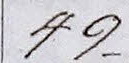49
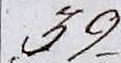39
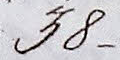38
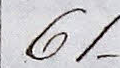61
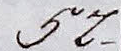52
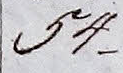54
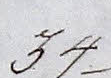34
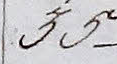35
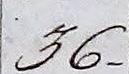36
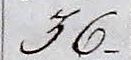36
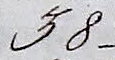38
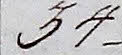34
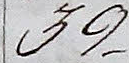39
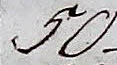50
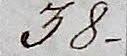38
